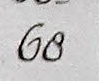68
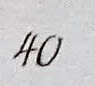40
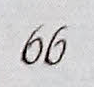66
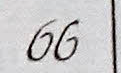66
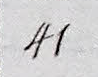41
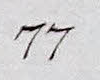77
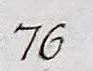76
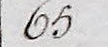65
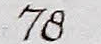78
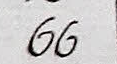66
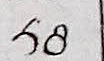58
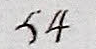54
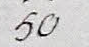50
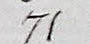71
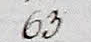63
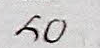50
